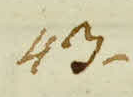43
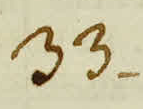33
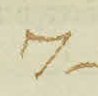7
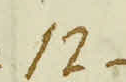12
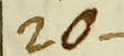20
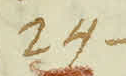24
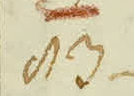83
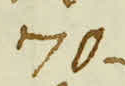70
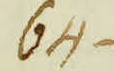64
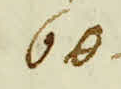60
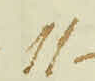11
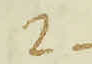2
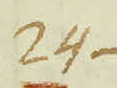24
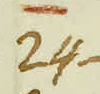24
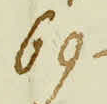69
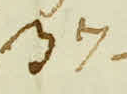37
